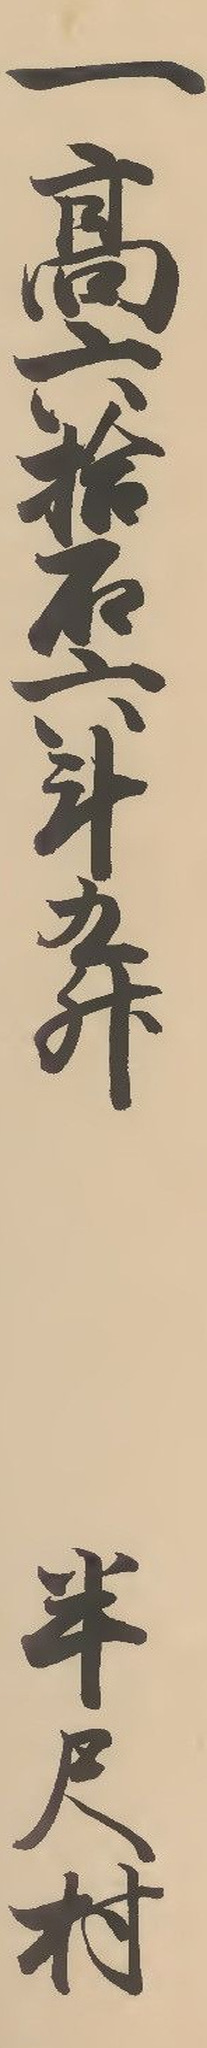一髙六拾石六斗九升半尺村
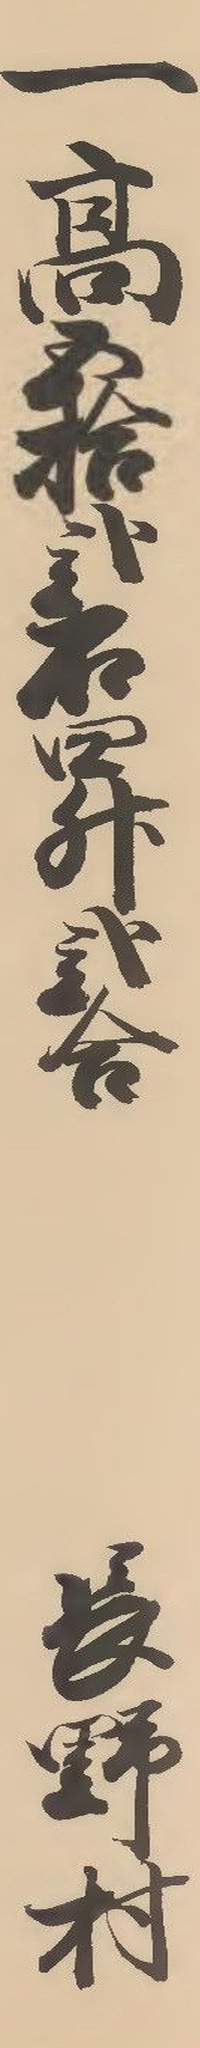一髙五拾弐石四升弐合長野村
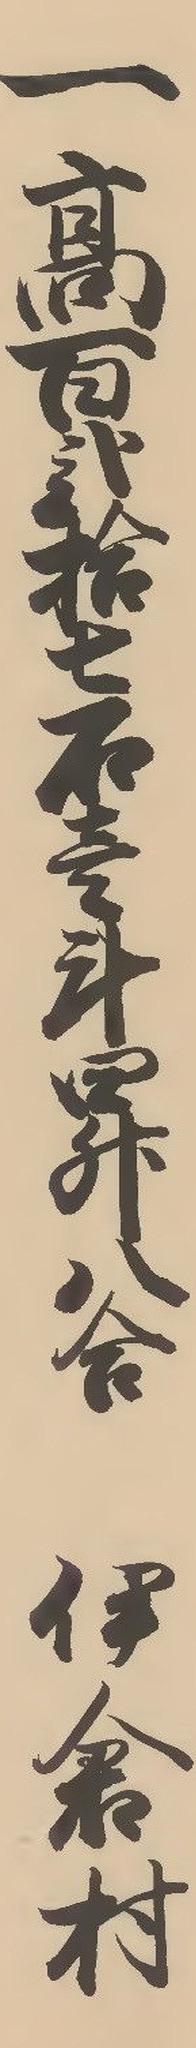一髙百弐拾七石壱斗四升八合伊倉村
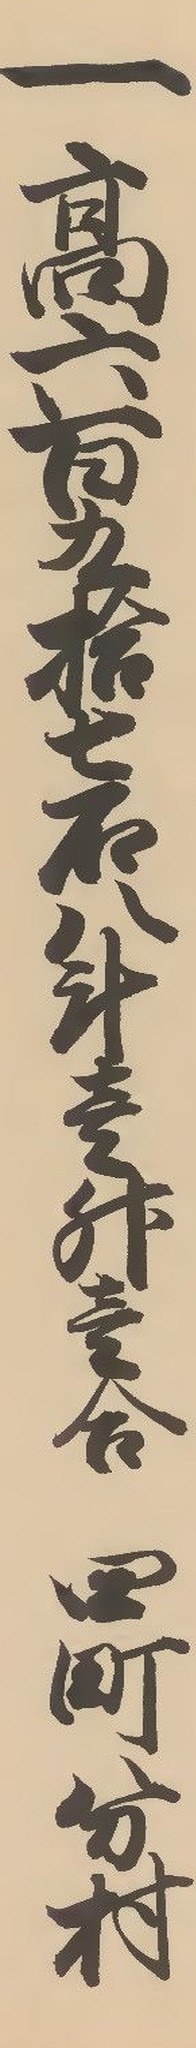一髙六百九拾七石八斗壱升壱合四町分村
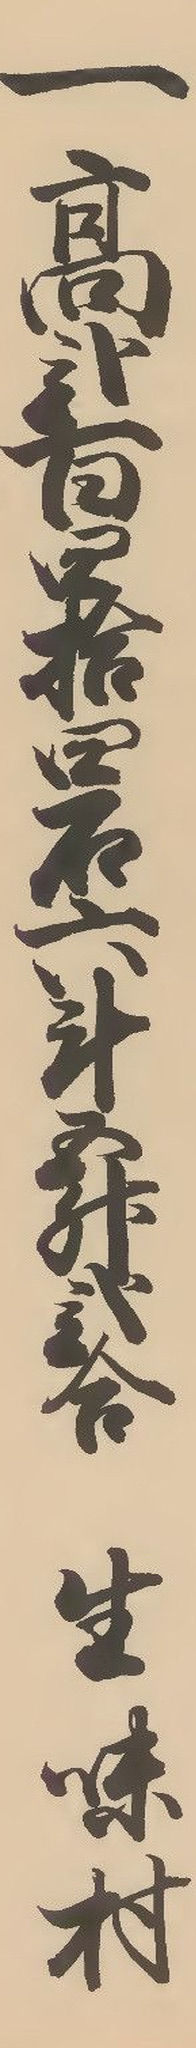一髙弐百四拾四石六斗五升弐合生味村

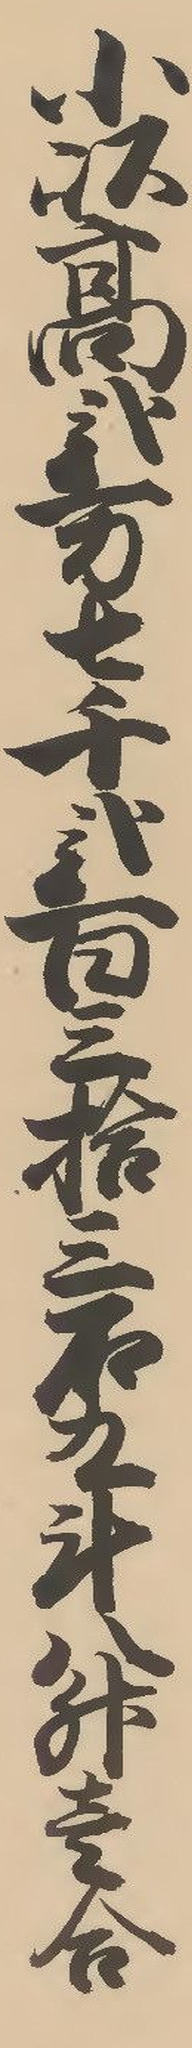小以髙二万七千弐百三拾三石九斗八升壱合
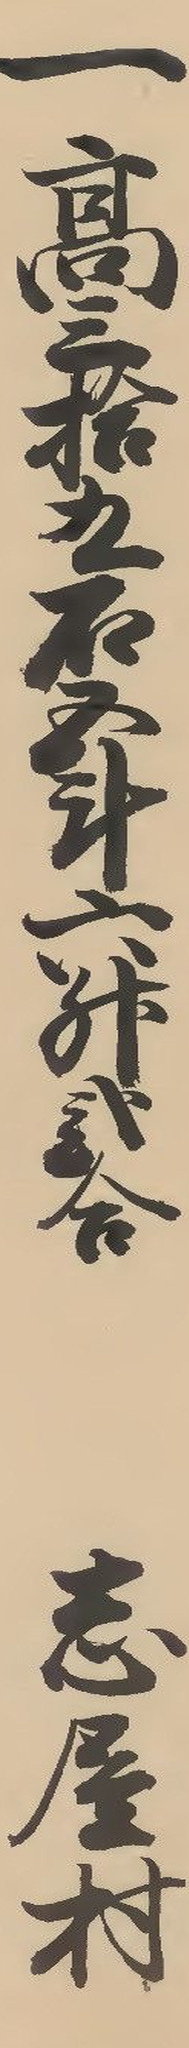一髙三拾九石五斗六升弐合志屋村
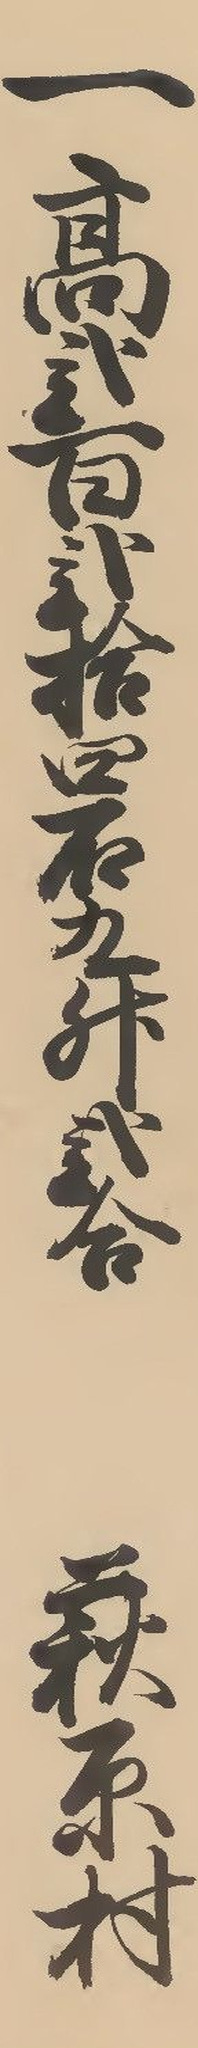一髙弐百弐拾四石九升弐合萩原村
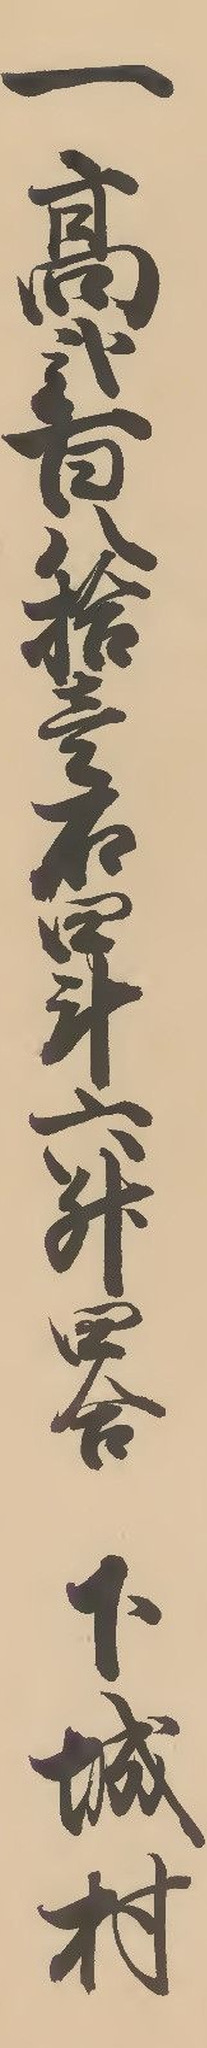一髙弐百八拾壱石四斗六升四合下城村

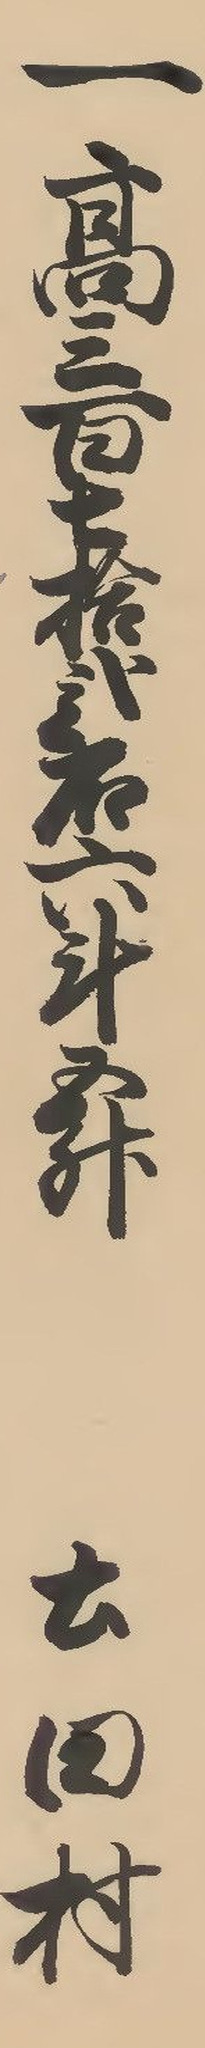一髙三百七拾弐石六斗五升土田村
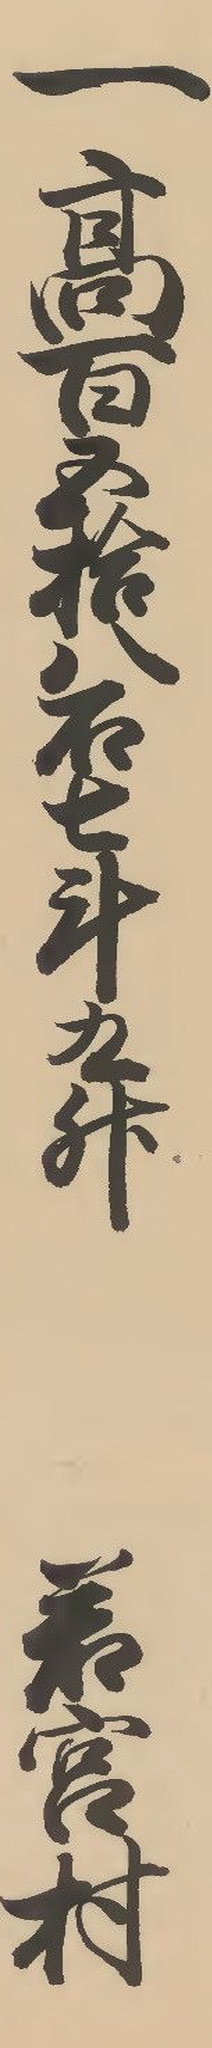一髙百五拾八石七斗九升若宮村
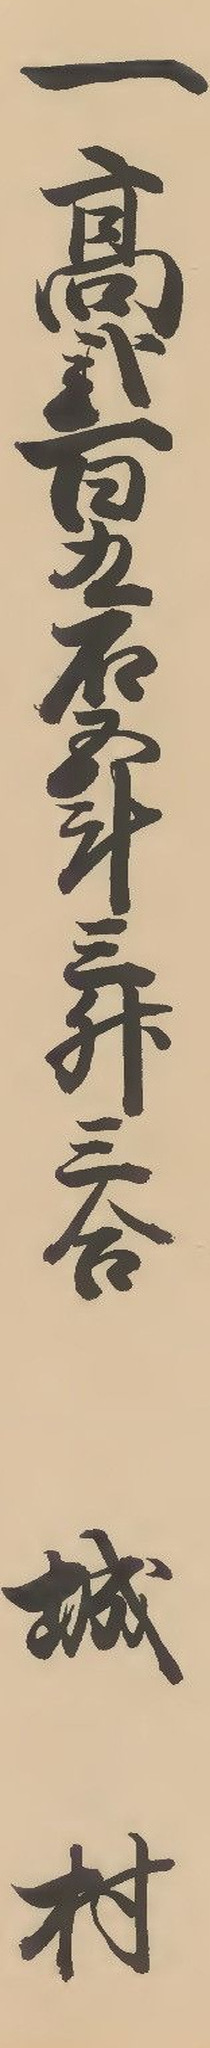一髙弐百九石五斗三升三合城村
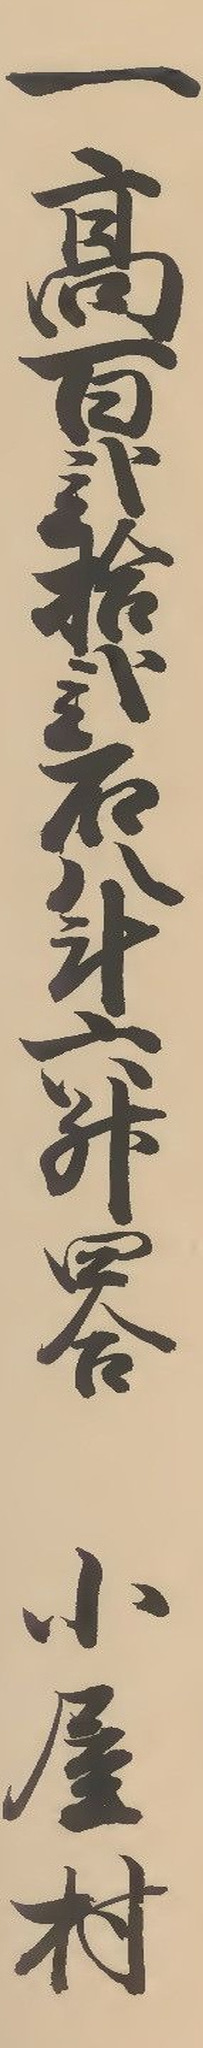一髙百弐拾弐石八斗六升四合小屋村
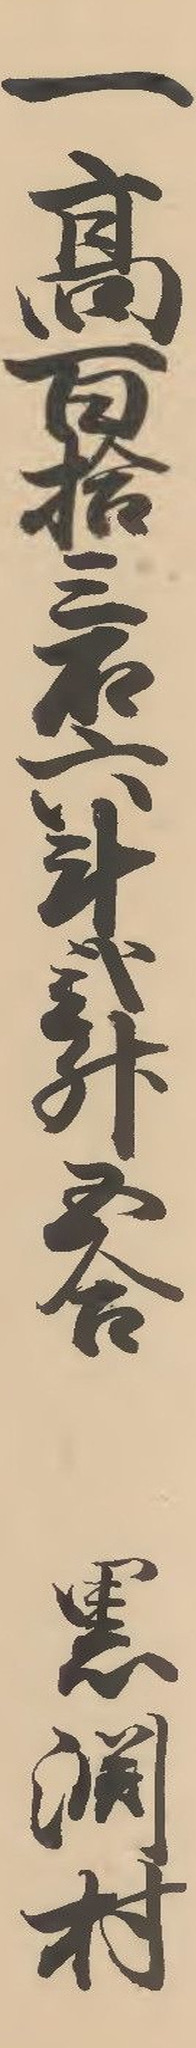一髙百拾三石六斗弐升五合黑淵村
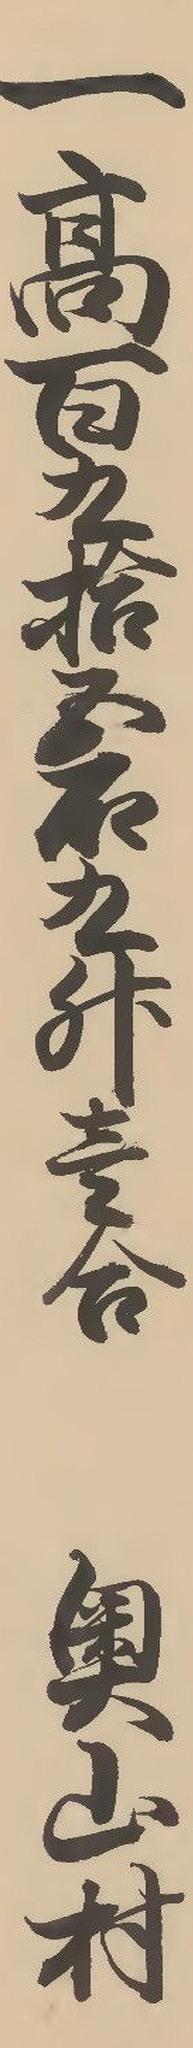一髙百九拾五石九升壱合奥山村
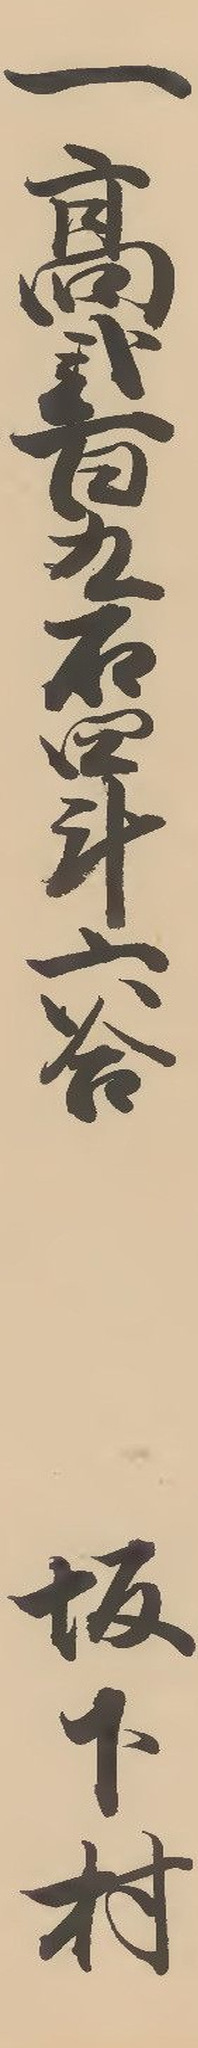一髙弐百九石四斗六合坂下村
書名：肥後国郷帳
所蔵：国立公文書館 National Archives of Japan
